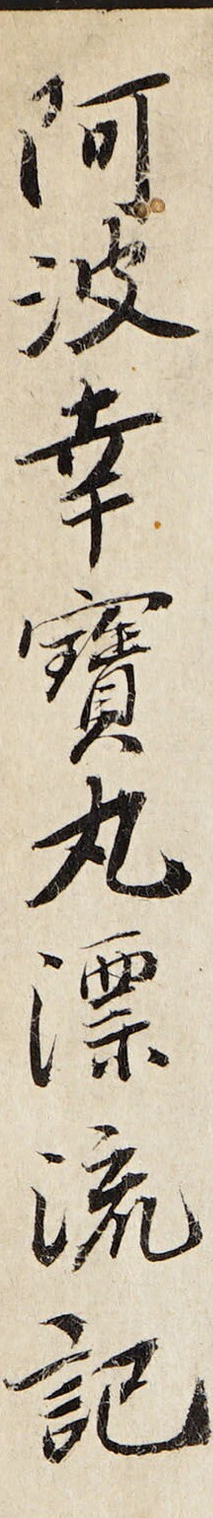阿波幸宝丸漂流記

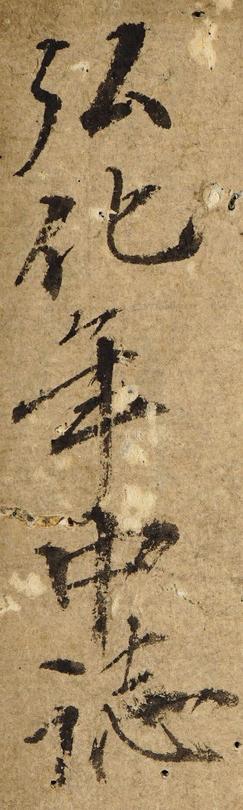弘化年中誌

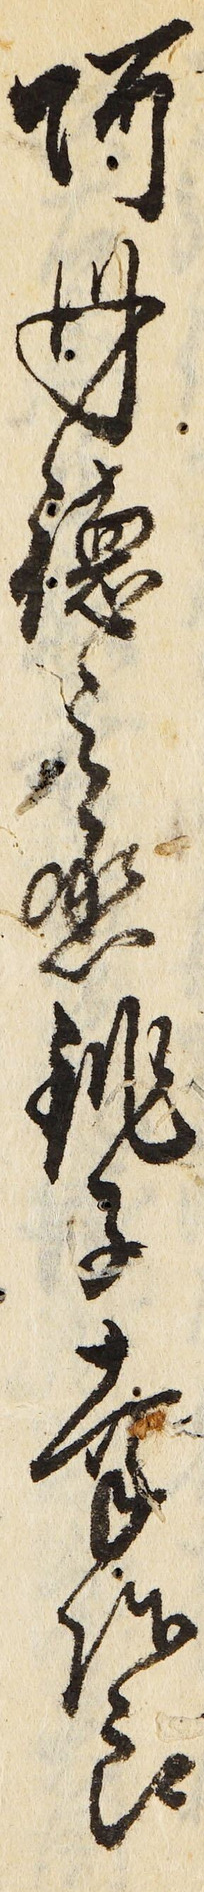阿州徳之丞銚子幸治郎
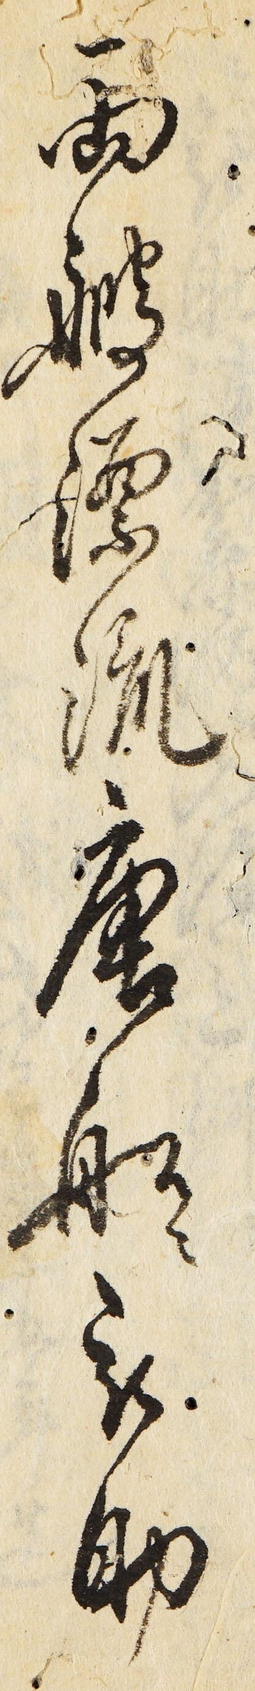両艘漂流唐船ニ被助
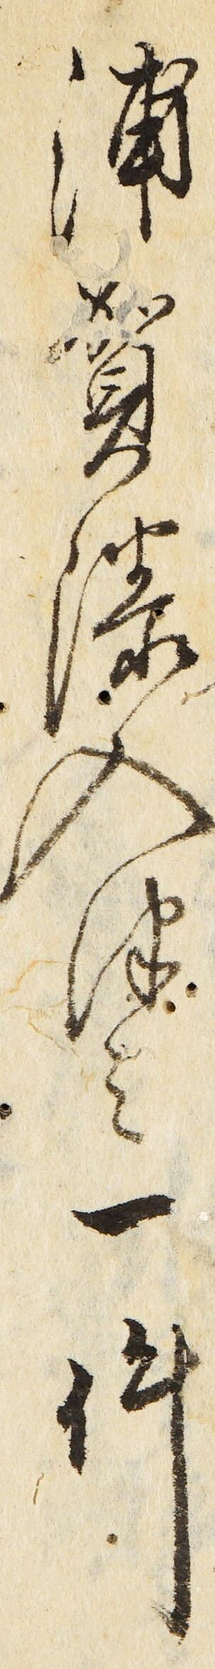浦賀湊入津之一件
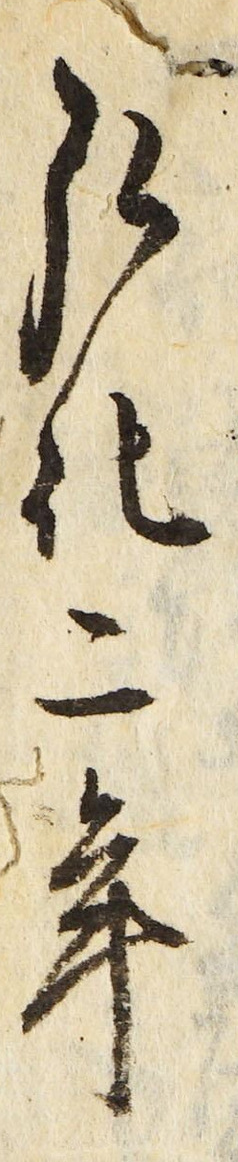弘化二年
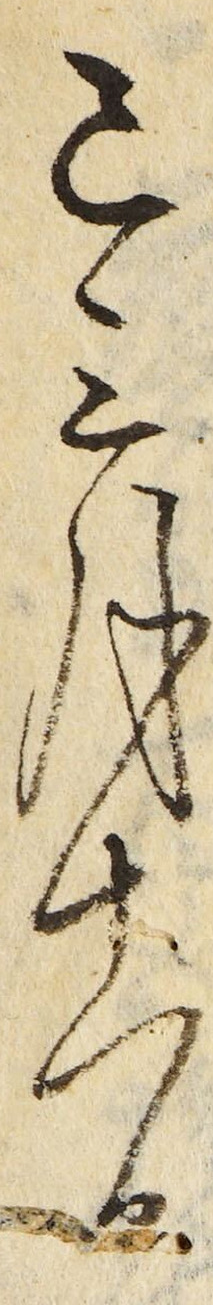巳三月十一日

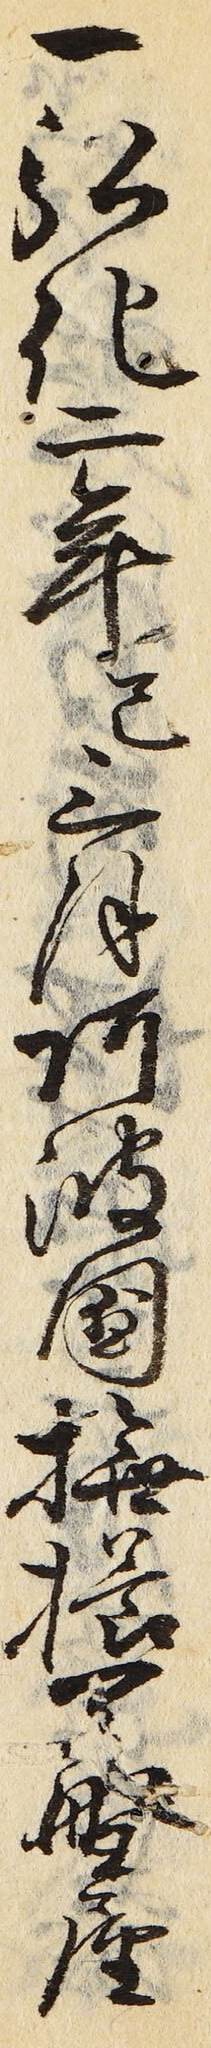一弘化二年巳三月阿波国撫攁天野屋
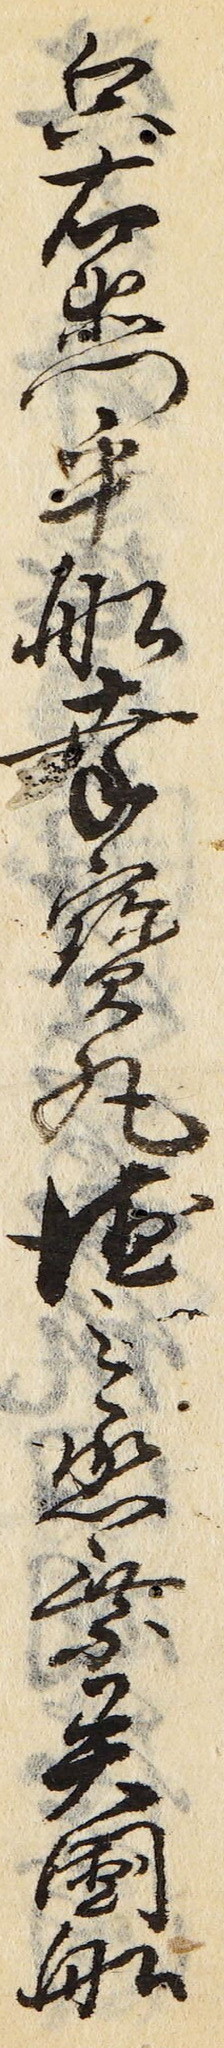兵右衛門手船幸宝丸徳之丞乗異国船
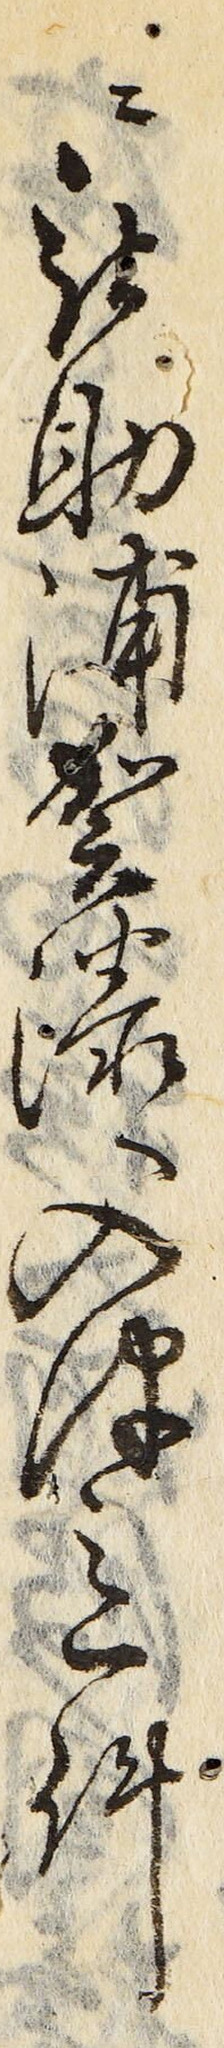ニ被助浦賀湊へ入津之一件
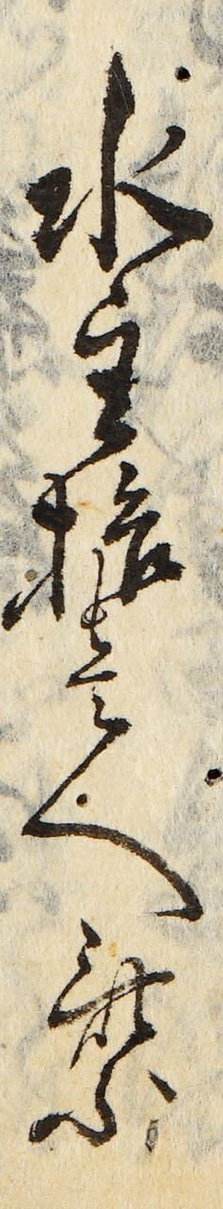水主拾壱人乗
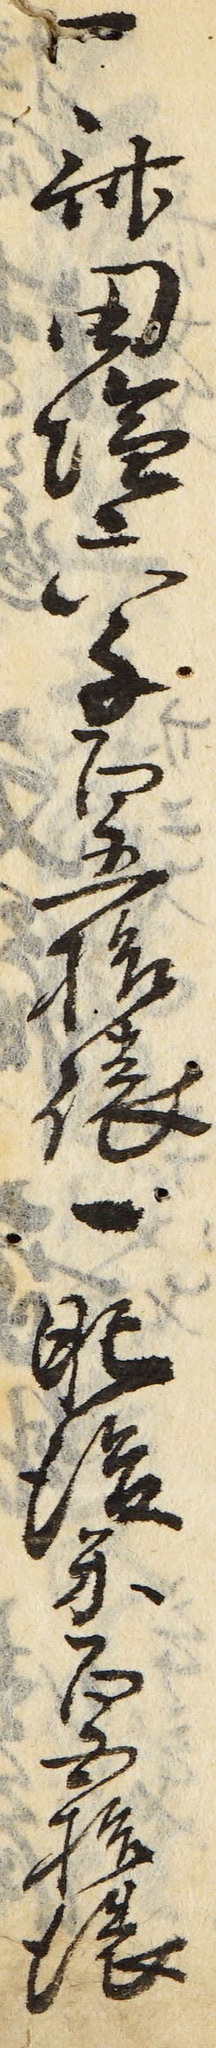一斎田塩六千百五拾俵一肥後米百五拾俵
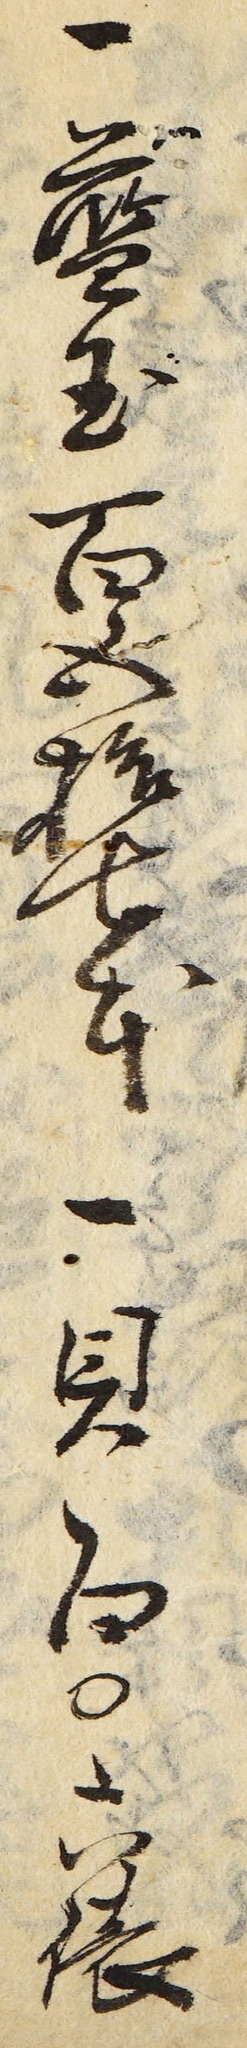一藍玉百五拾七本一貝百〇六俵

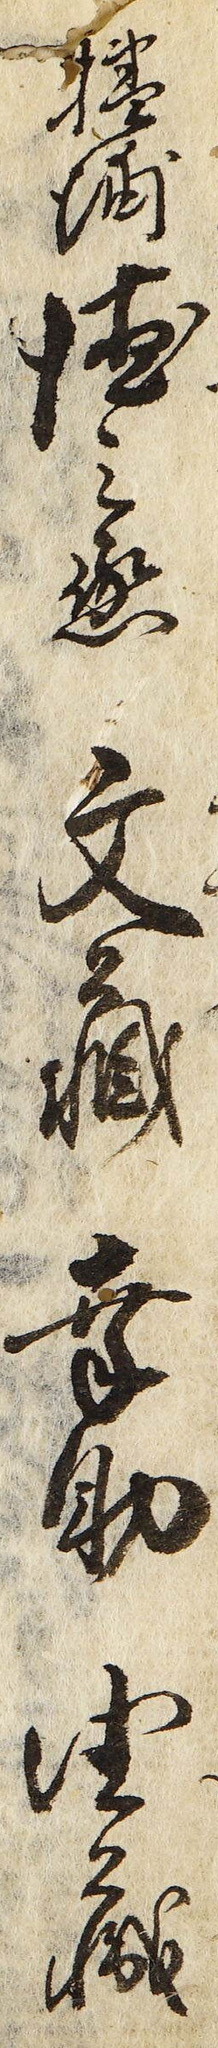橘浦徳之丞文蔵幸助由蔵
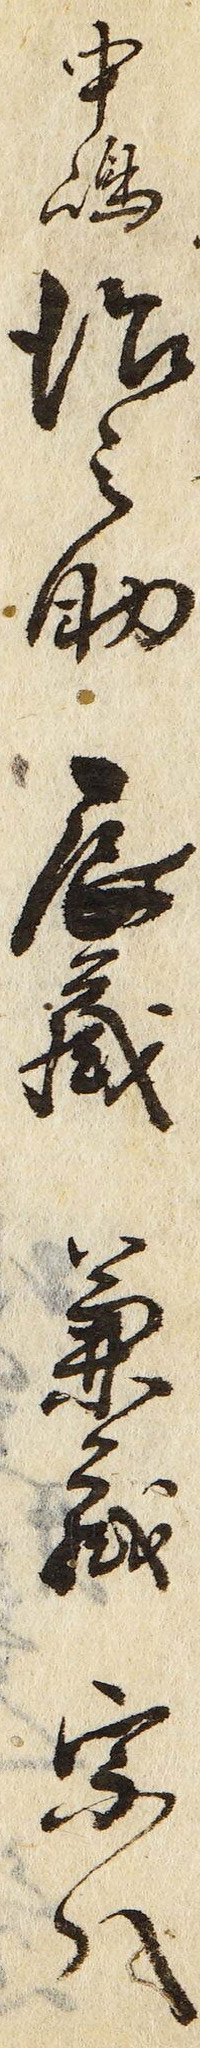中嶋治之助辰蔵兼蔵宗八
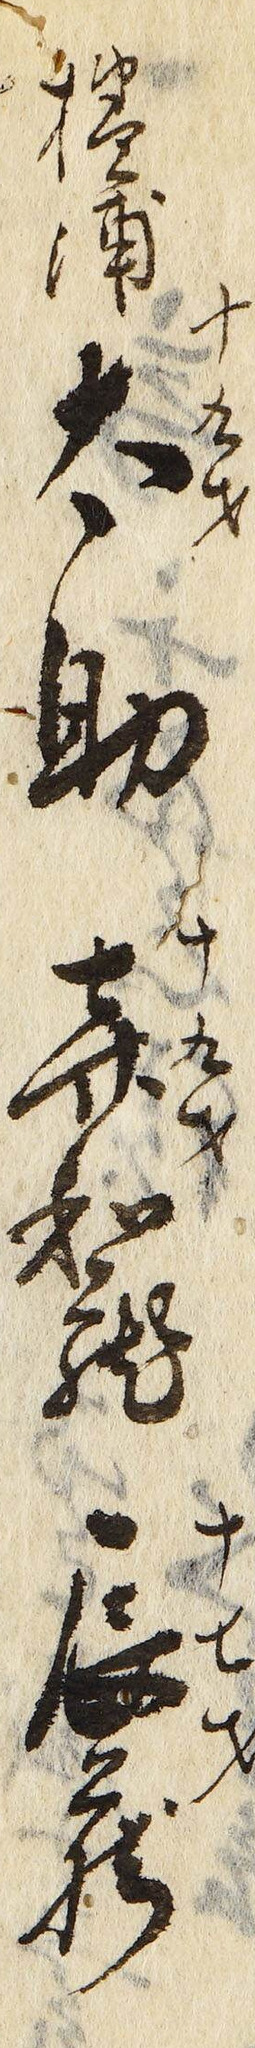橘浦太助喜和蔵辰蔵
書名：阿波幸宝丸漂流記
